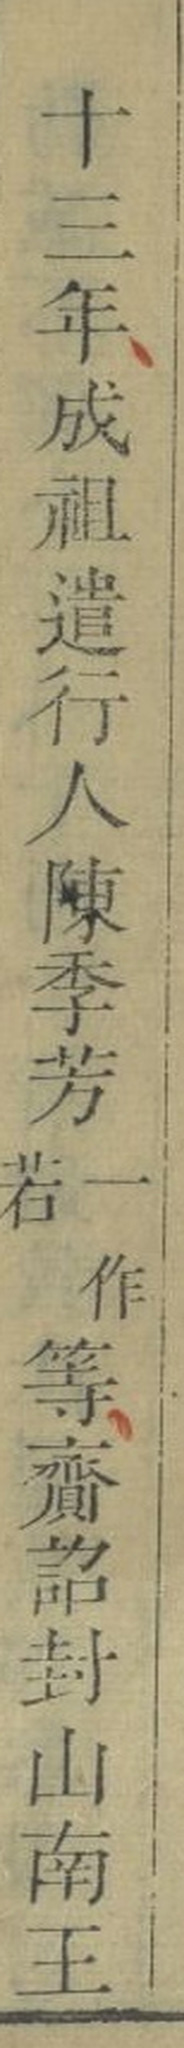十三年成祖遣行人陳季芳一作若等齎詔封山南王
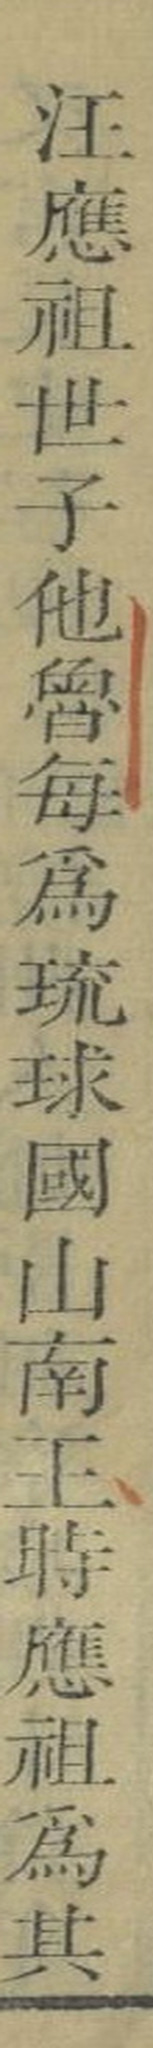汪応祖世子他魯毎為琉球国山南王時応祖為其
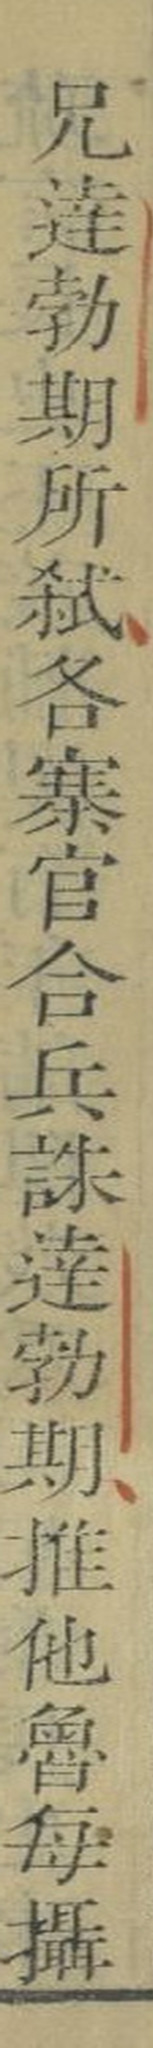兄達勃期所弑各寨官合兵誅達勃期推他魯毎摂
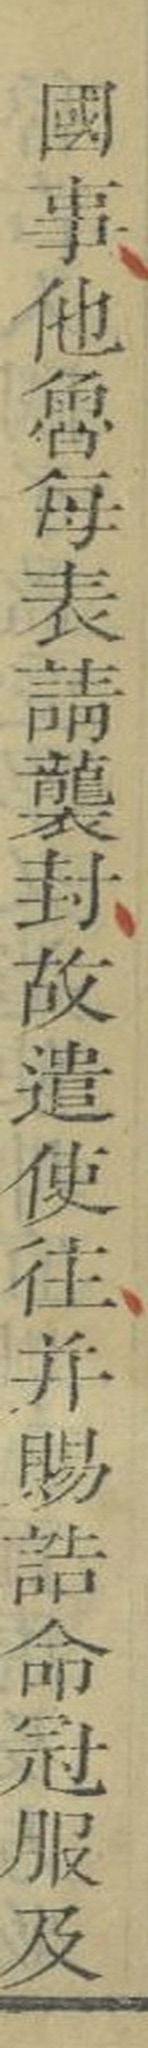国事他魯毎表請襲封故遣使往并賜誥命冠服及
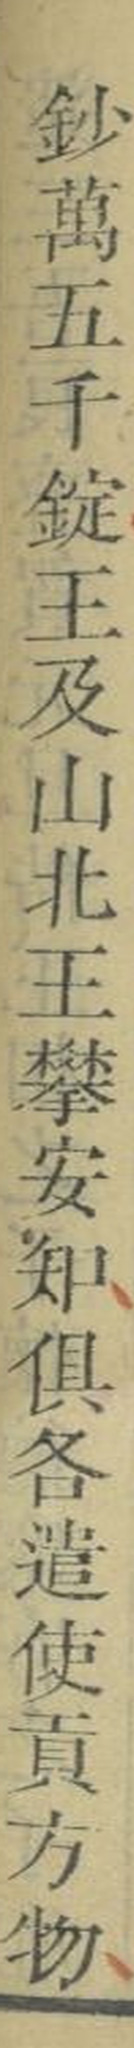鈔万五千錠王及山北王攀安知俱各遣使貢方物
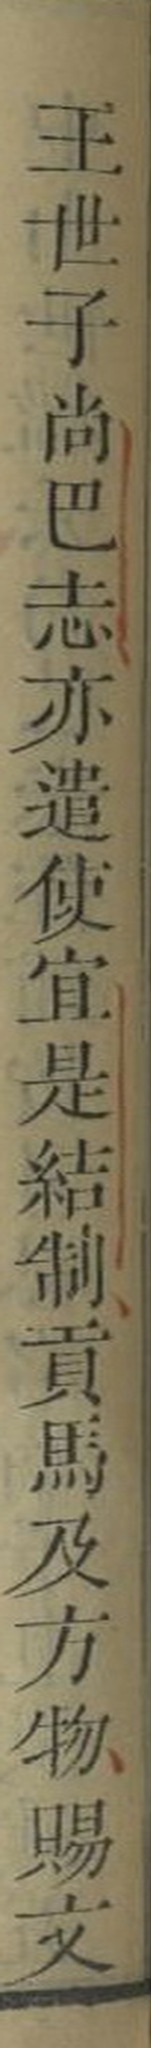王世子尚巴志亦遣使宜是結制貢馬及方物賜文
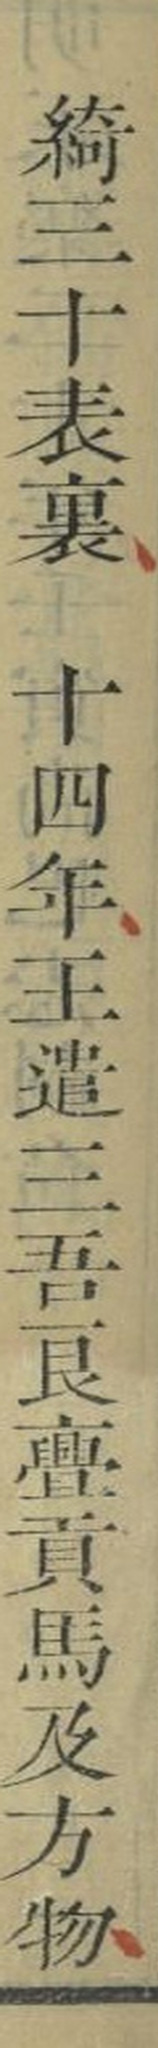綺三十表裏十四年王遣三吾良亹貢馬及方物
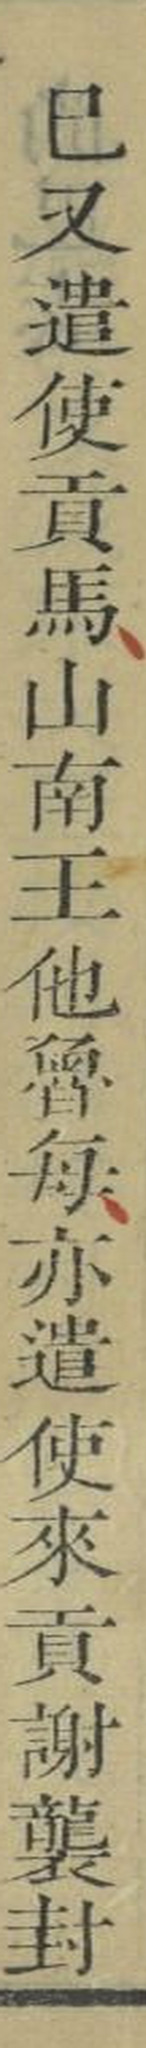巳又遣使貢馬山南王他魯毎亦遣使来貢謝襲封
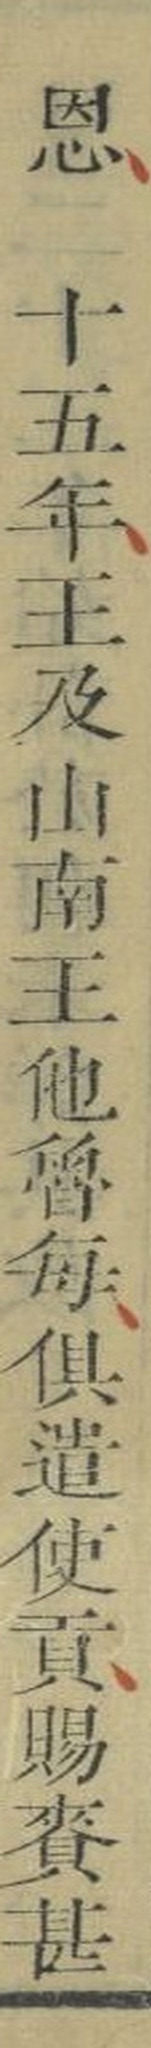恩十五年王及山南王他魯毎俱遣使貢賜賚甚
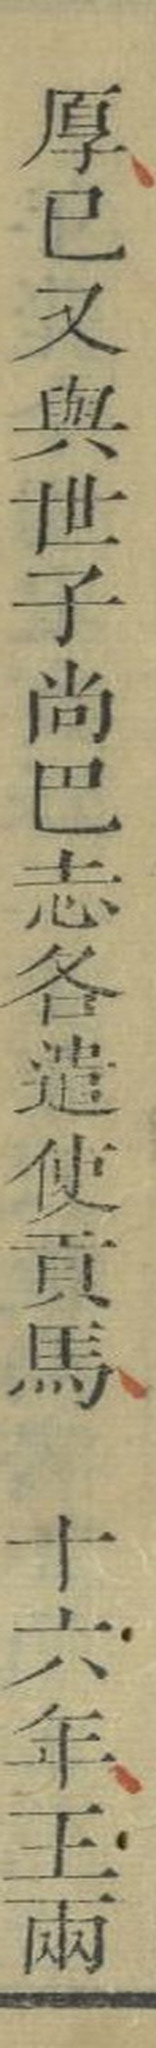厚巳又与世子尚巴志各遣使貢馬十六年王両
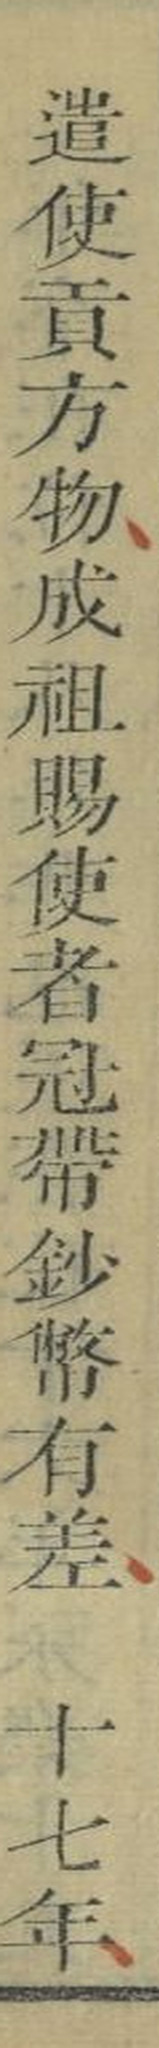遣使貢方物成祖賜使者冠帯鈔幣有差十七年
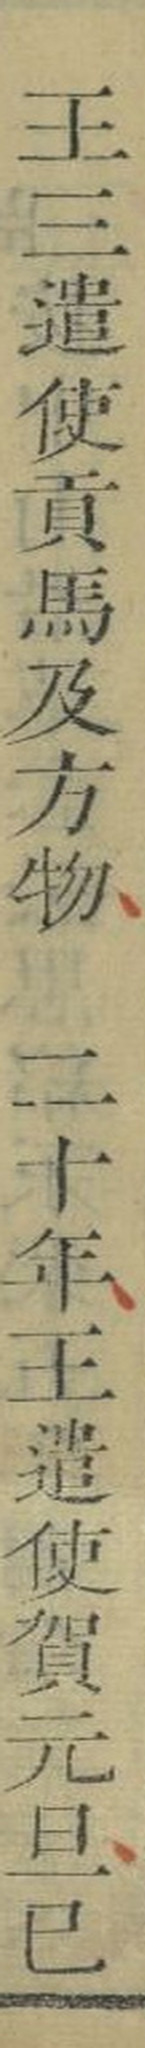王三遣使貢馬及方物二十年王遣使賀元旦巳
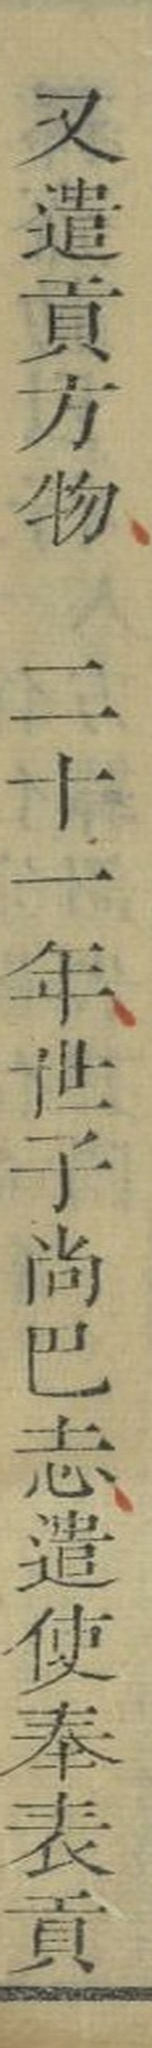又遣貢方物二十一年世子尚巴志遣使奉表貢
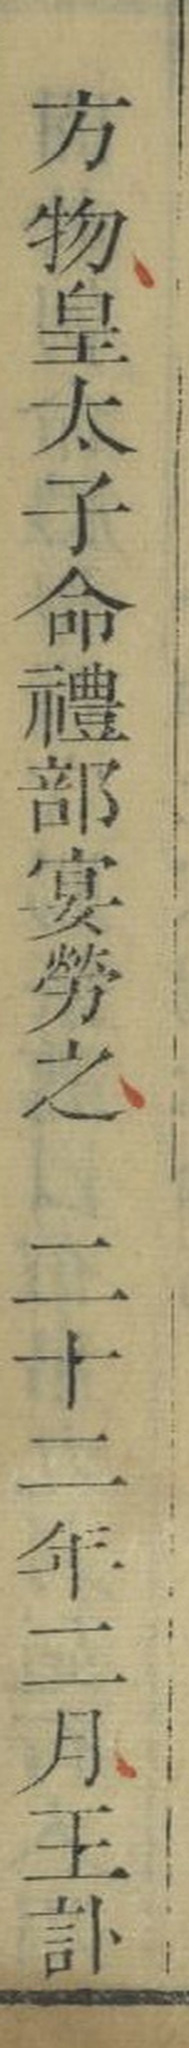方物皇太子命礼部宴労之二十二年二月王訃

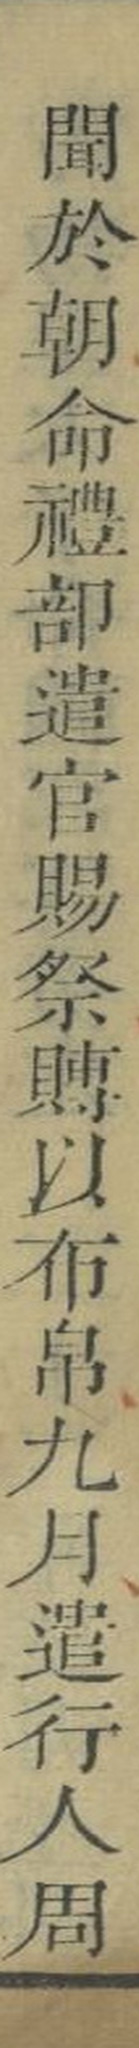聞於朝命礼部遣官賜祭賻以布帛九月遣行人周
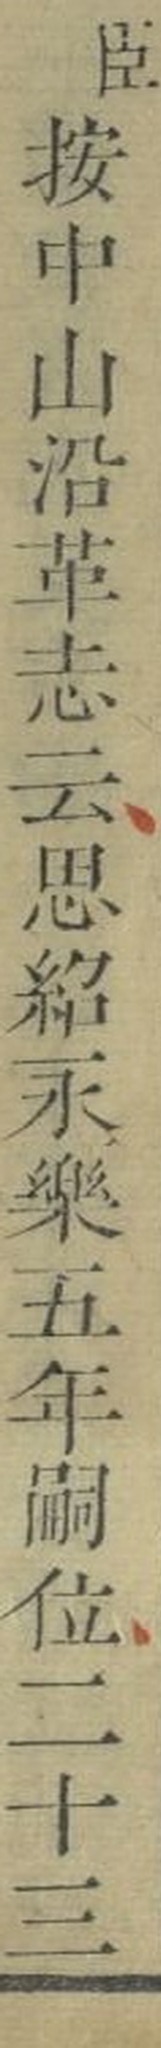臣按中山沿革志云思紹永楽五年嗣位二十三
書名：中山伝信録 巻三
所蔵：University of the Ryukyus Library
